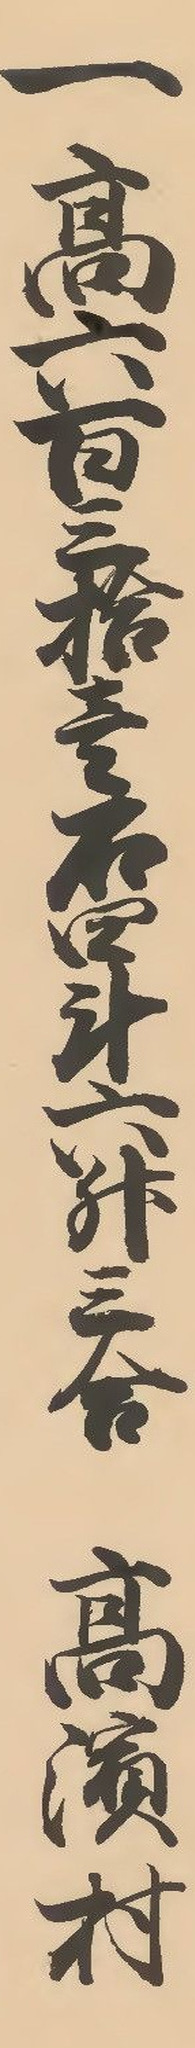一髙六百三拾壱石四斗六升三合高濱村
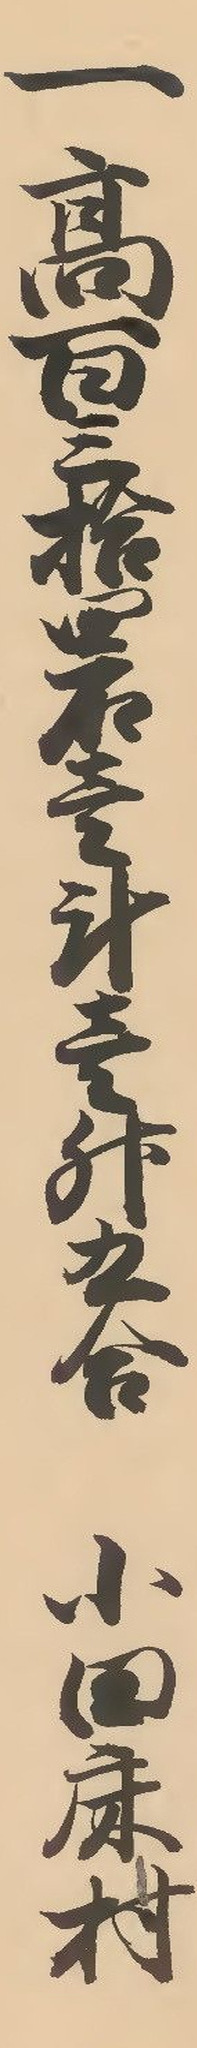一髙百三拾四石壱斗壱升九合小田床村
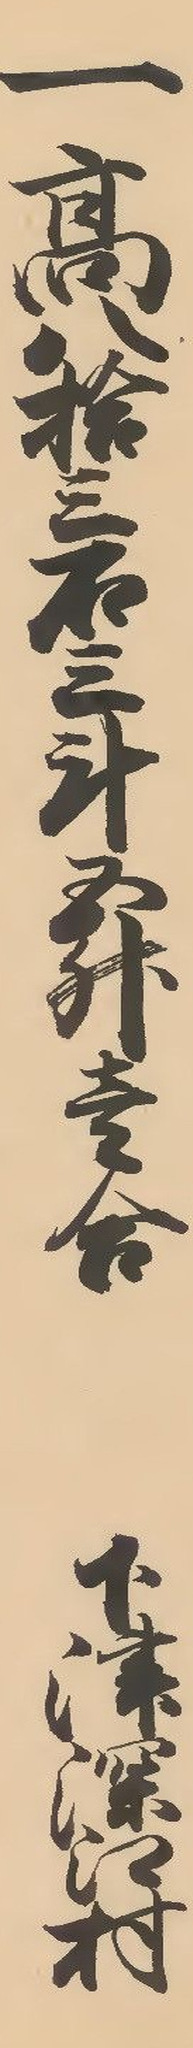一髙八拾三石三斗五升壱合下津深江村
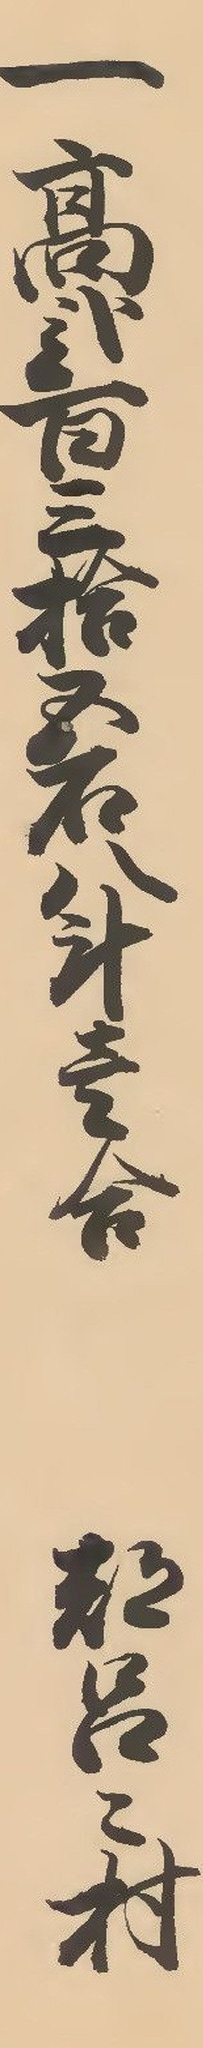一髙弐百三拾五石八斗壱合都呂々村
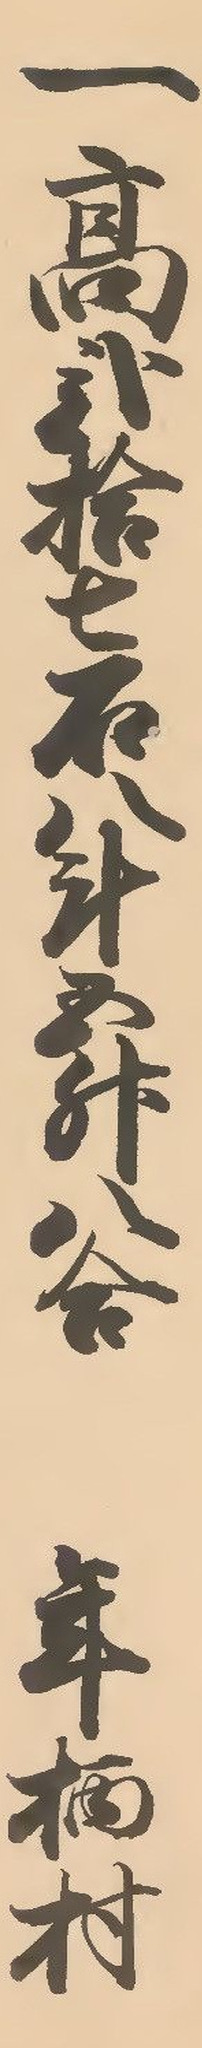一髙弐拾七石八斗五升八合年柄村
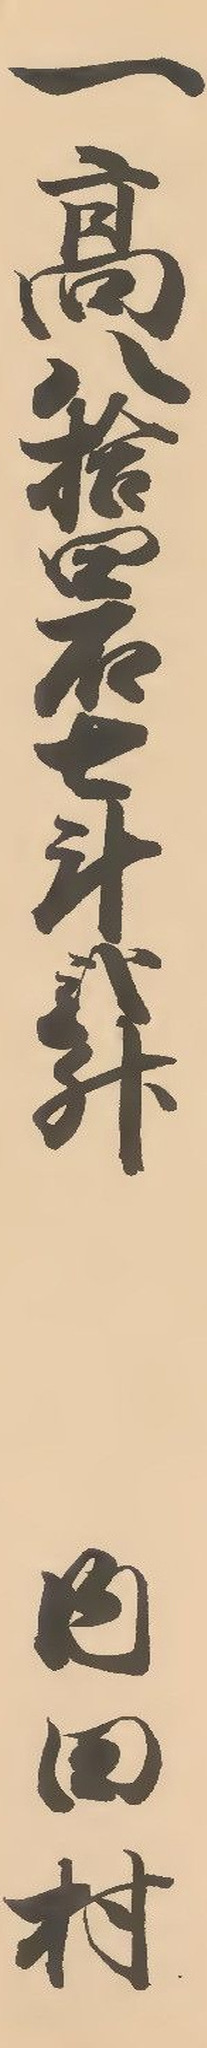一髙八拾四石七斗弐升内田村
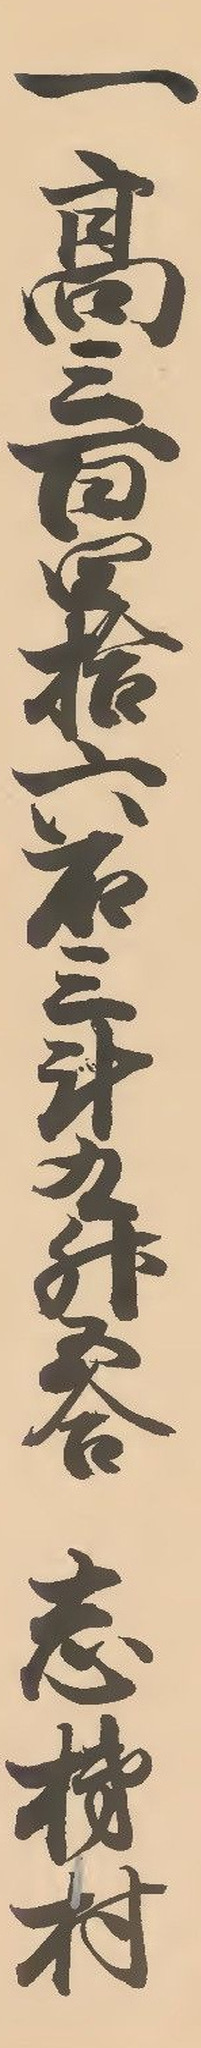一髙三百四拾六石三斗九升五合志機村
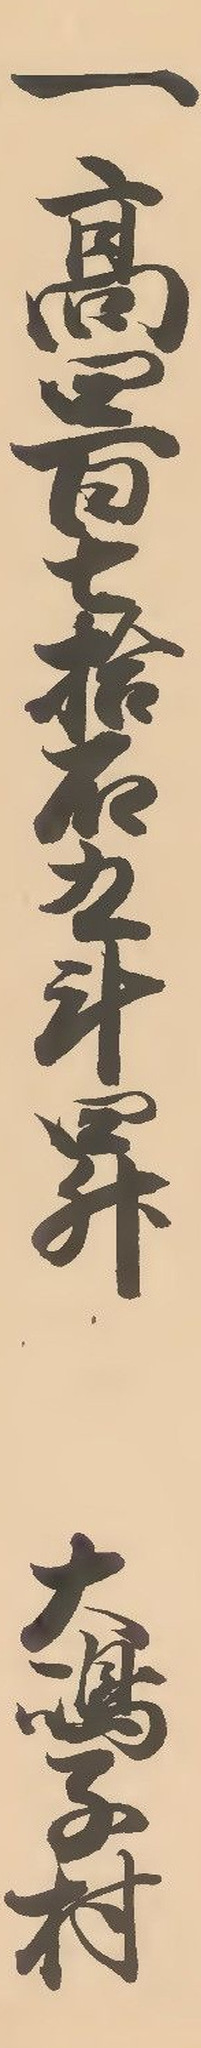一髙四百七拾石九斗四升大嶋子村

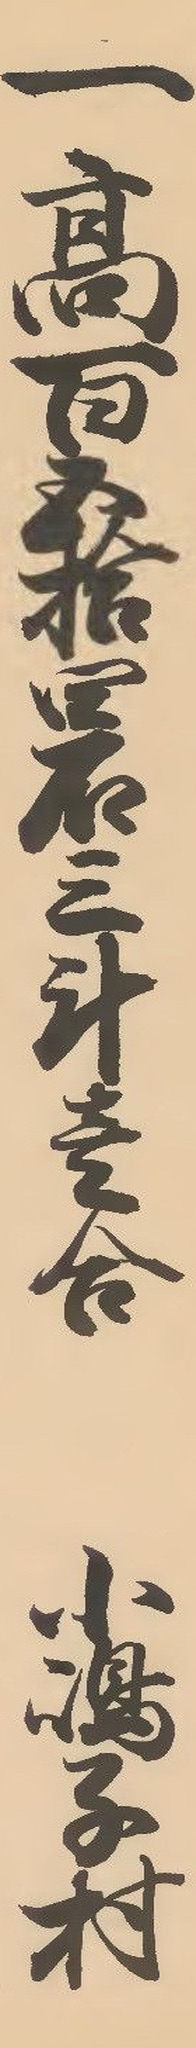一髙百五拾四石三斗壱合小嶋子村
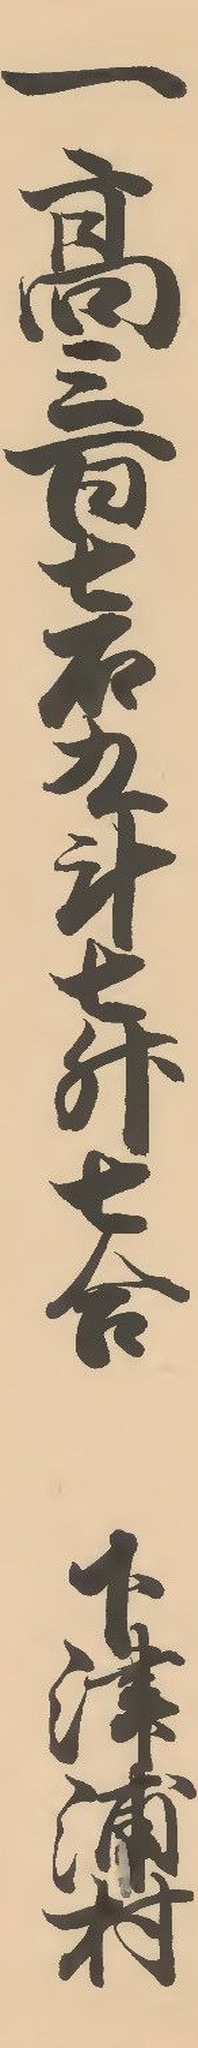一髙三百七石九斗七升七合下津浦村
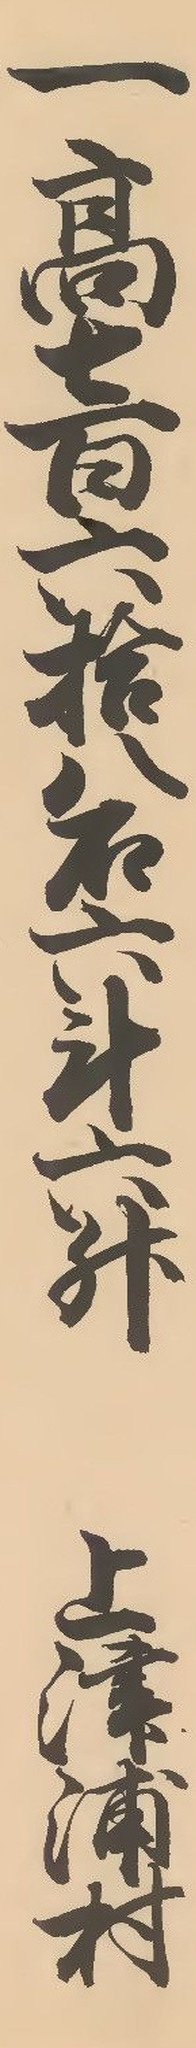一髙七百六拾八石六斗六升上津浦村
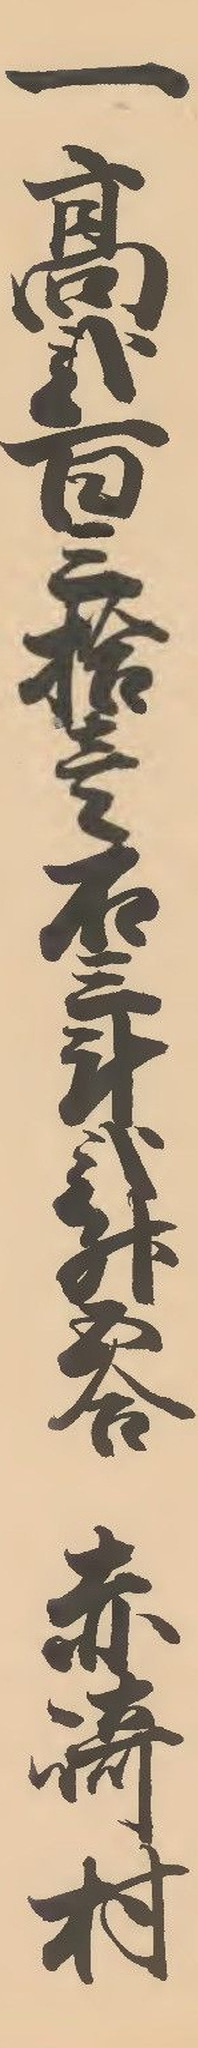一髙弐百三拾壱石三斗弐升五合赤崎村
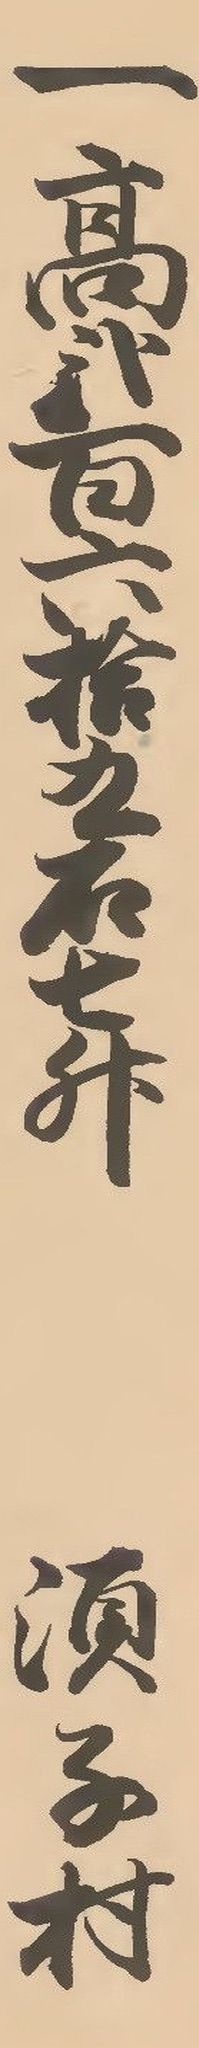一髙弐百六拾九石七升須子村
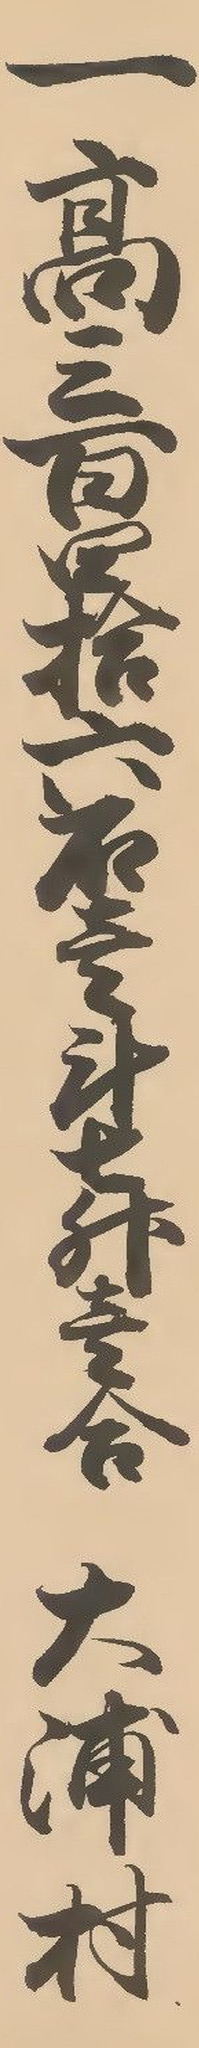一髙三百四拾六石壱斗七升壱合大浦村
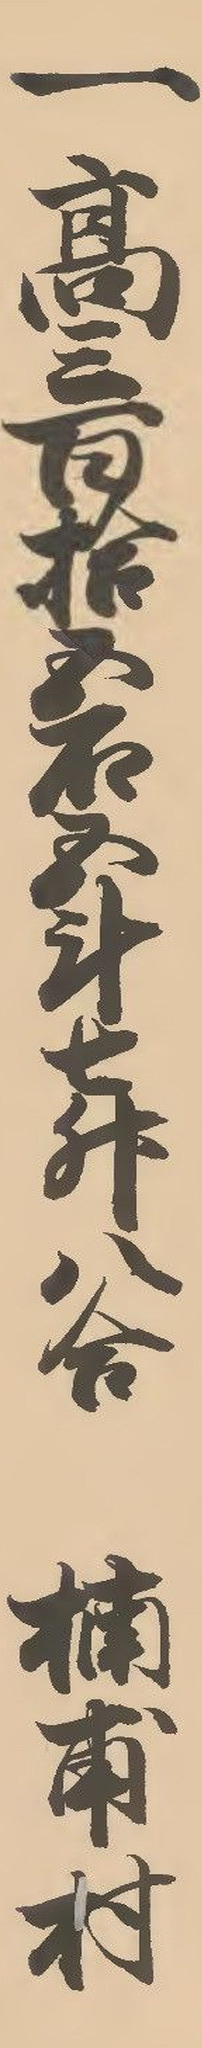一髙三百拾五石五斗七升八合楠甫村
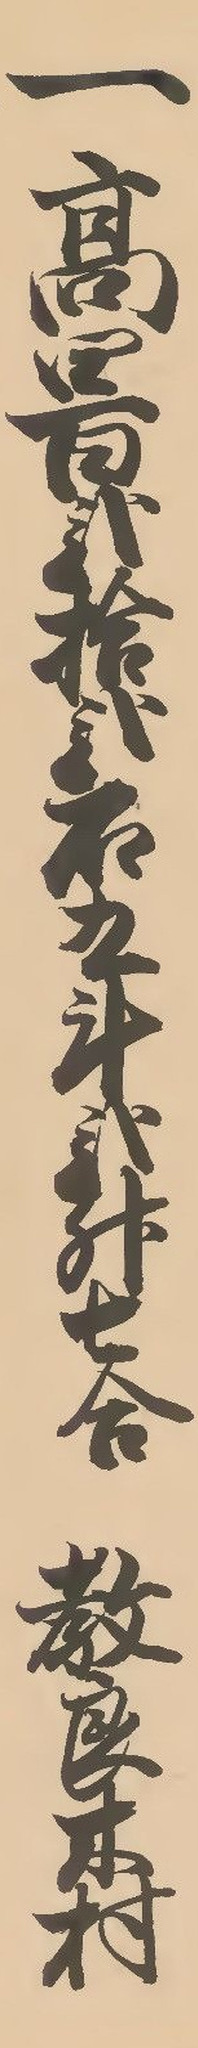一髙四百弐拾弐石九斗弐升七合教良木村
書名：肥後国郷帳
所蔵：国立公文書館 National Archives of Japan
